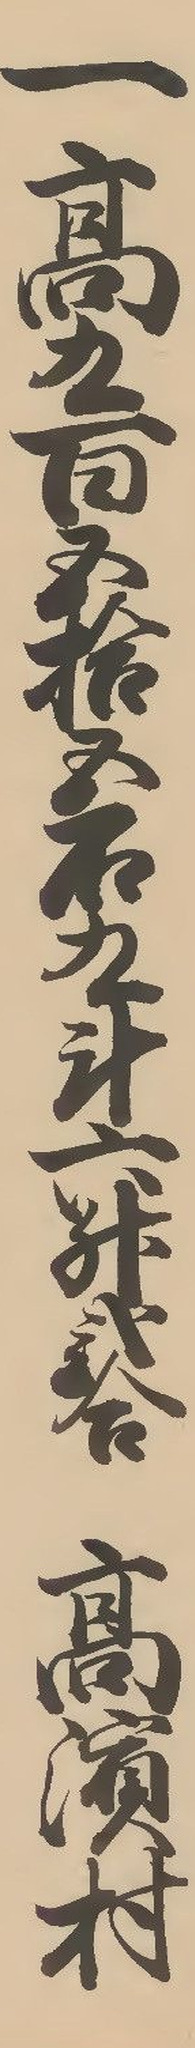一髙九百五拾五石九斗六升弐合髙濱村
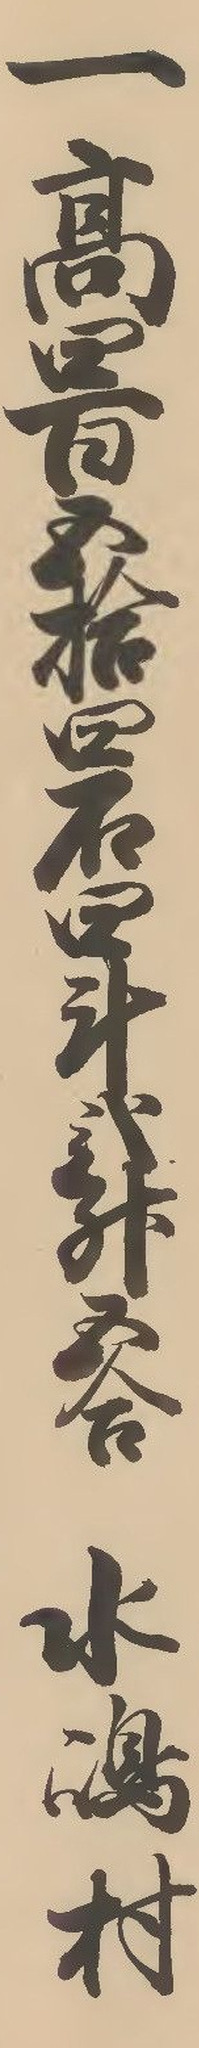一髙四百五拾四石四斗弐升五合水嶋村
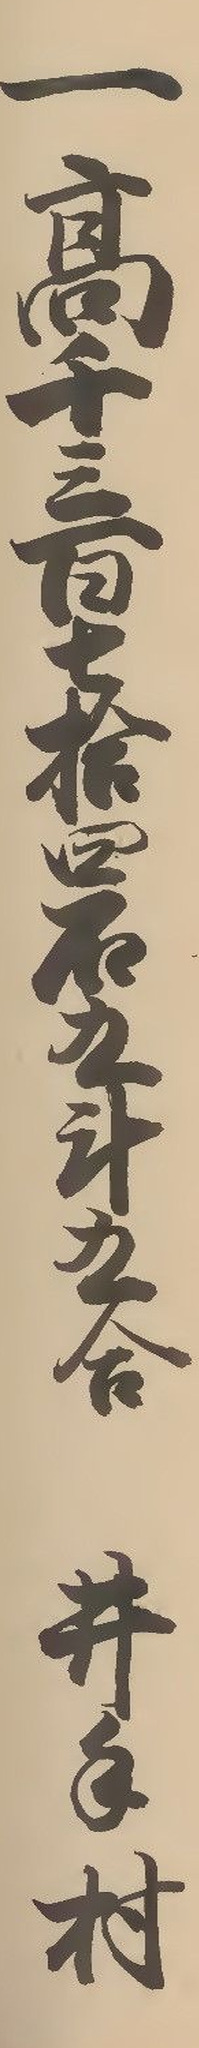一髙千三百七拾四石九斗九合井手村
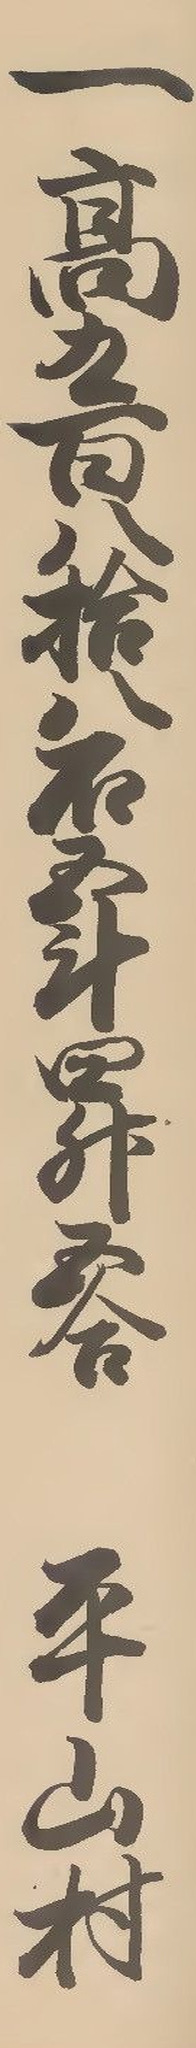一髙九百八拾八石五斗四升五合平山村
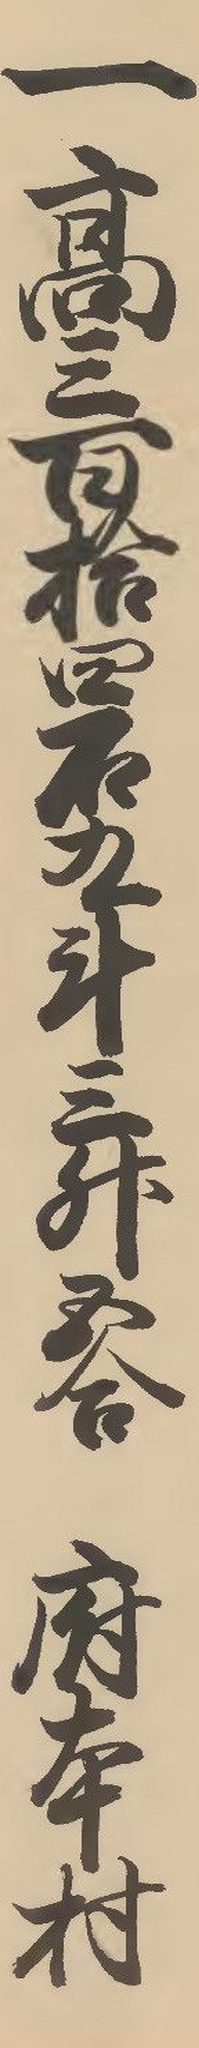一髙三百拾四石九斗三升五合府本村
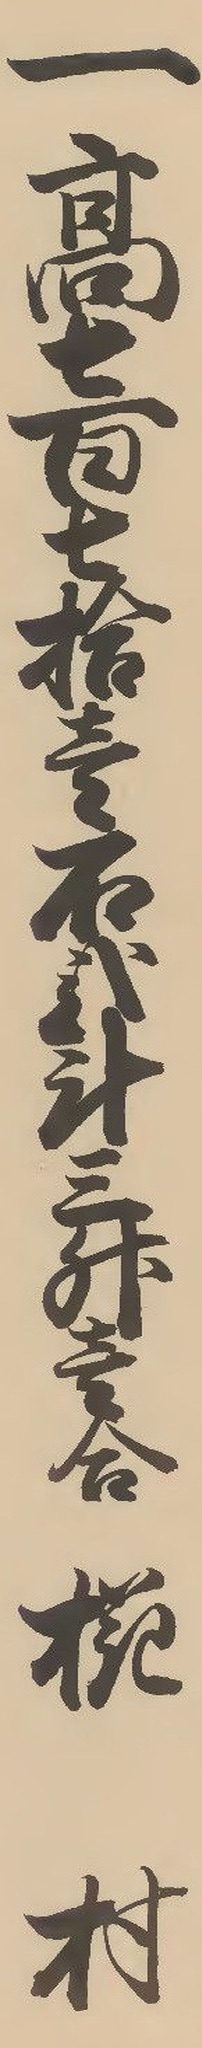一髙七百七拾壱石弐斗三升壱合村
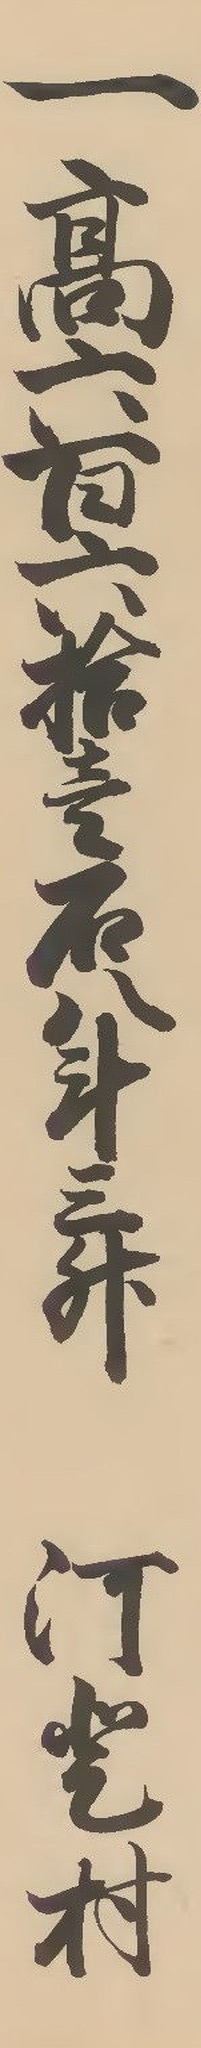一髙六百六拾壱石八斗三升河登村

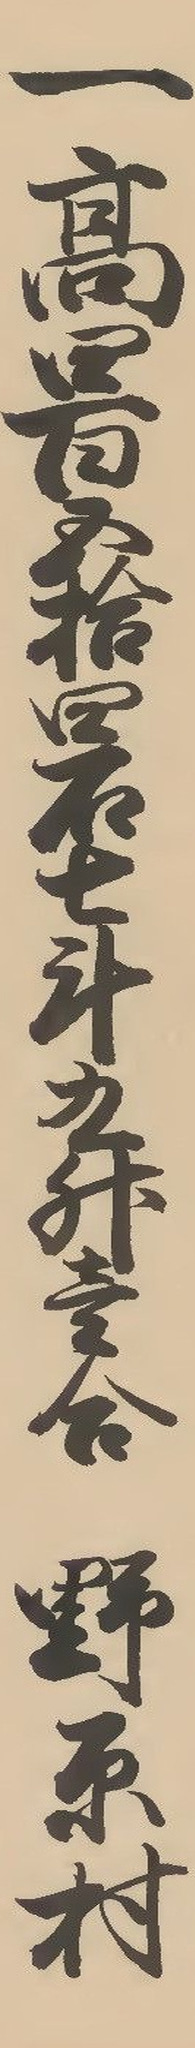一髙四百五拾四石七斗九升壱合野原村
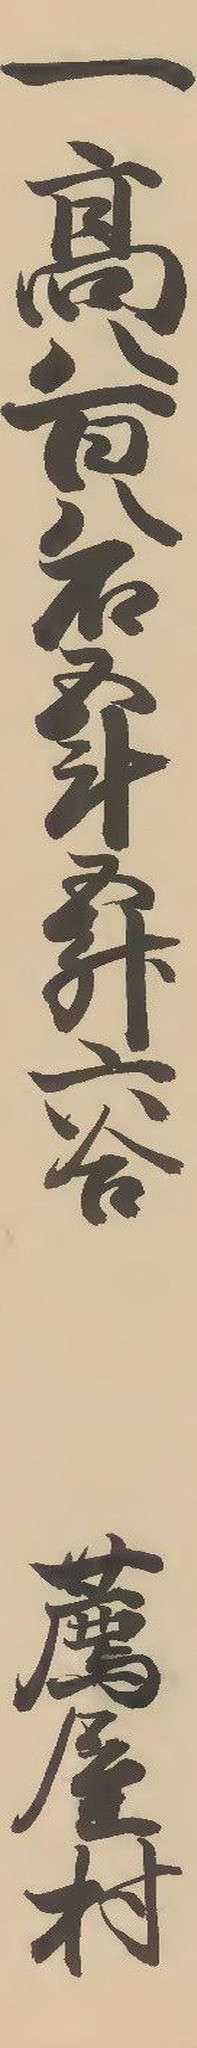一髙八百八石五斗五升六合薦屋村
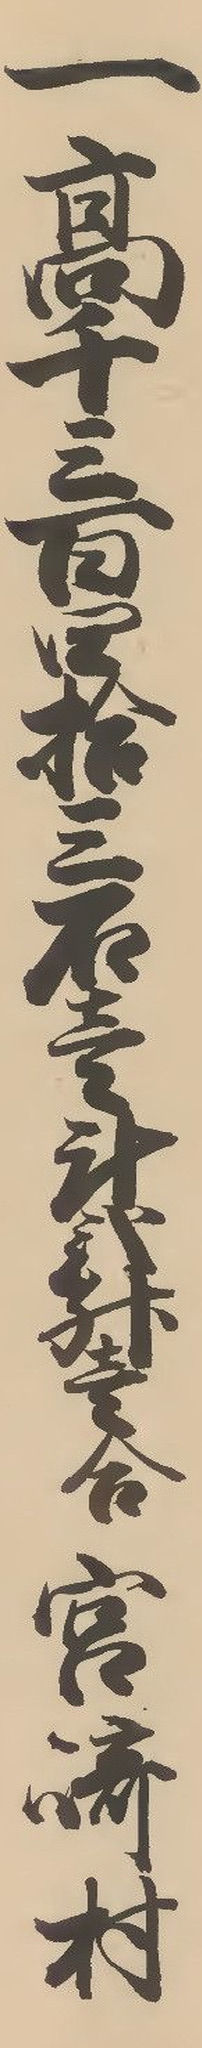一髙千三百四拾三石壱斗弐升壱合宮崎村
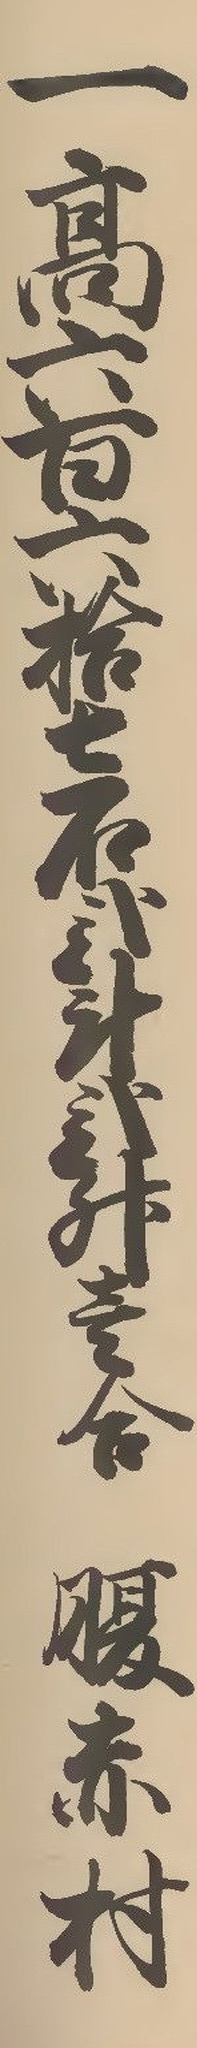一髙六百六拾七石弐斗弐升壱合腹赤村
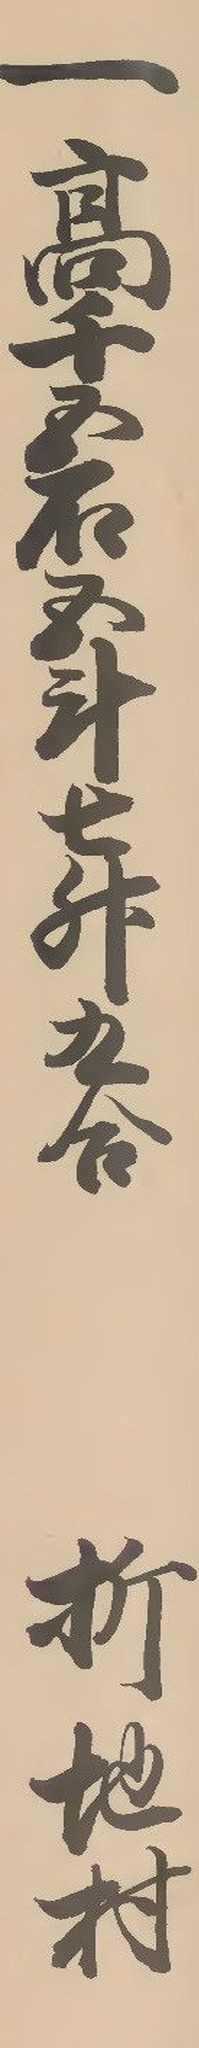一髙千五石五斗七升九合折地村
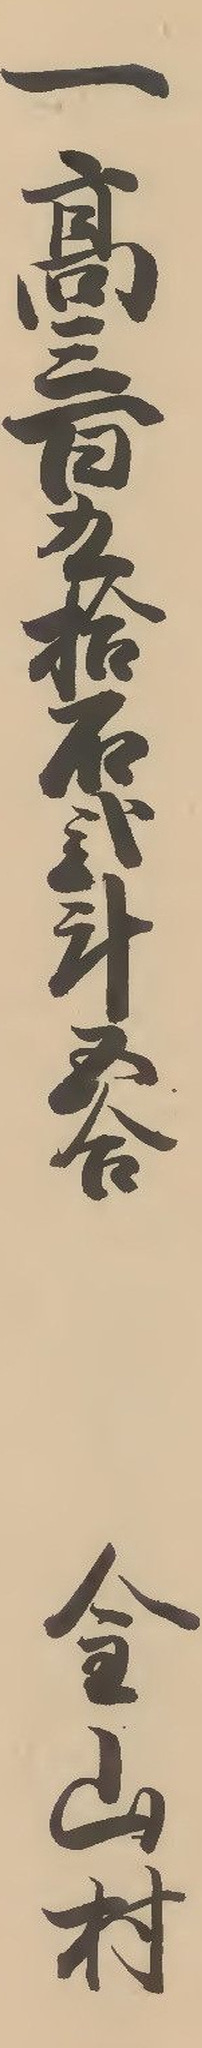一髙三百九拾石弐斗五合金山村
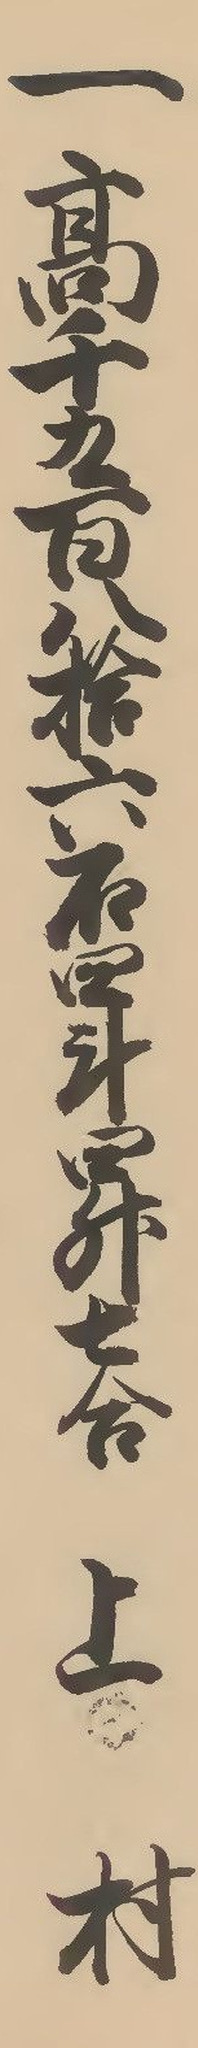一髙千九百八拾六石四斗四升七合上村
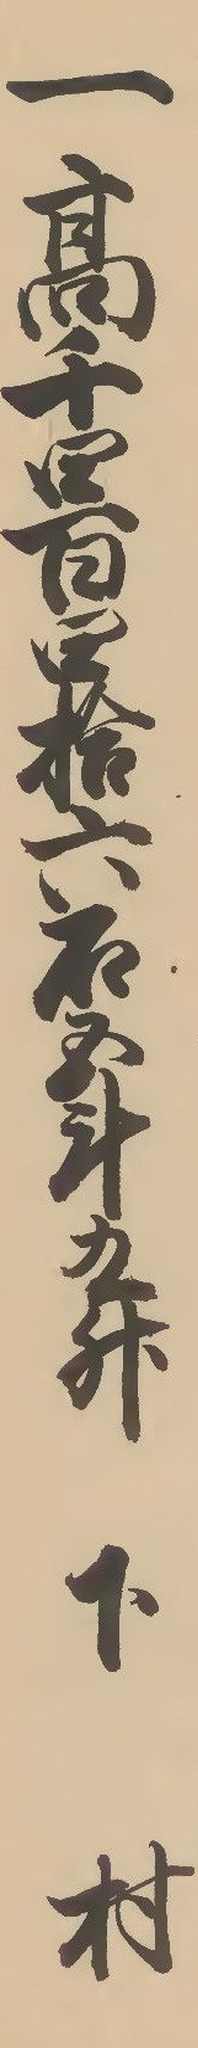一髙千四百四拾六石五斗九升下村

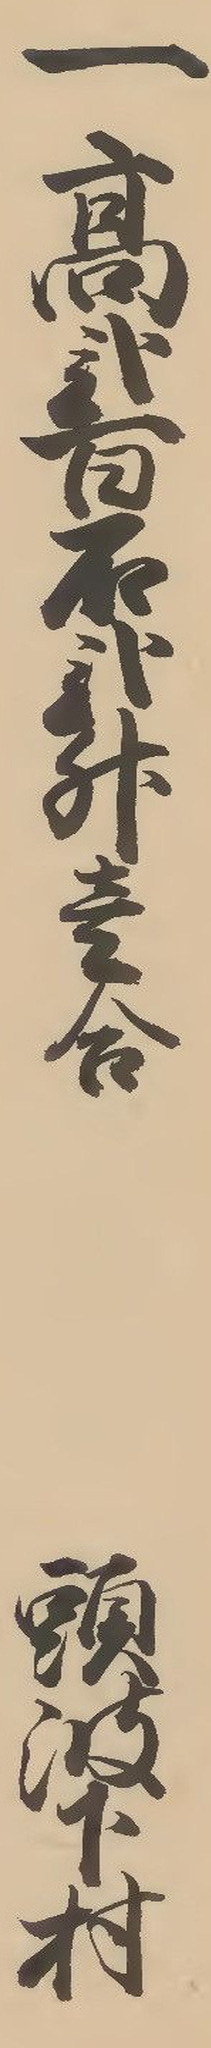一髙弐百石弐升壱合頭波下村
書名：肥後国郷帳
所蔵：国立公文書館 National Archives of Japan
